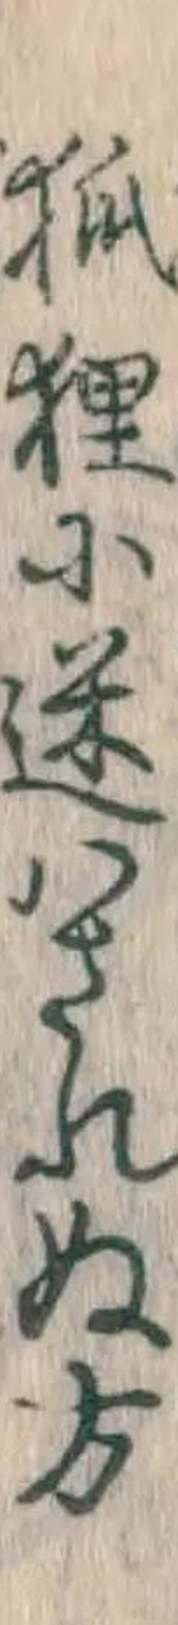狐狸に迷はされぬ方
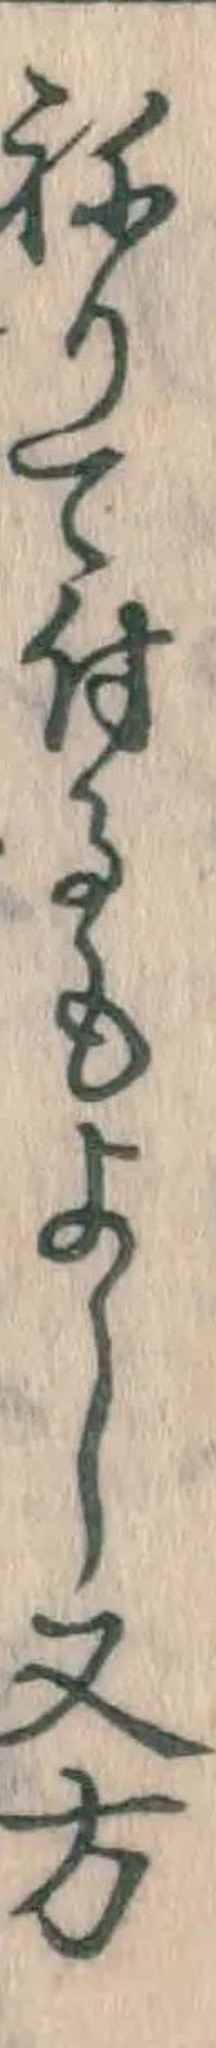ねりて付るもよし又方
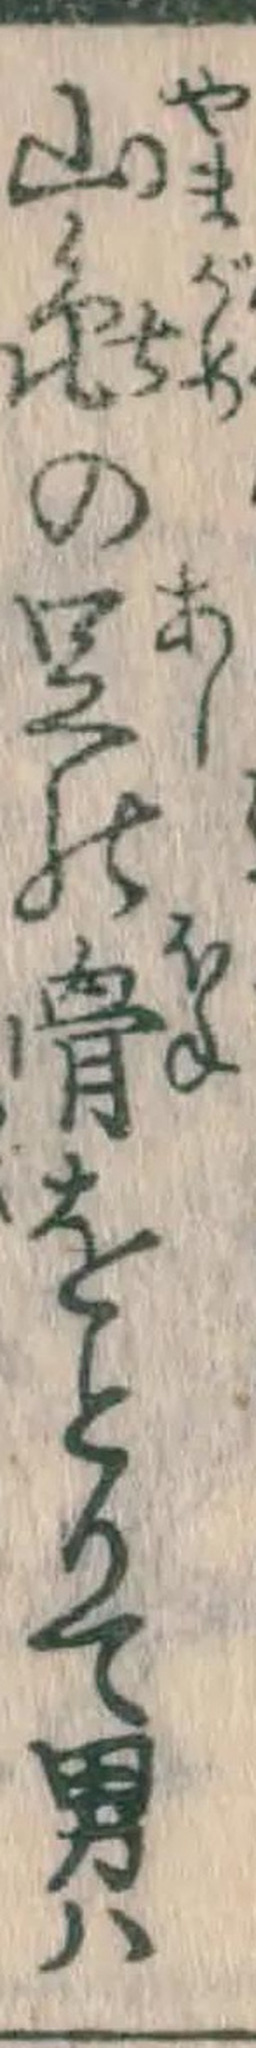山亀の足の骨をとりて男は
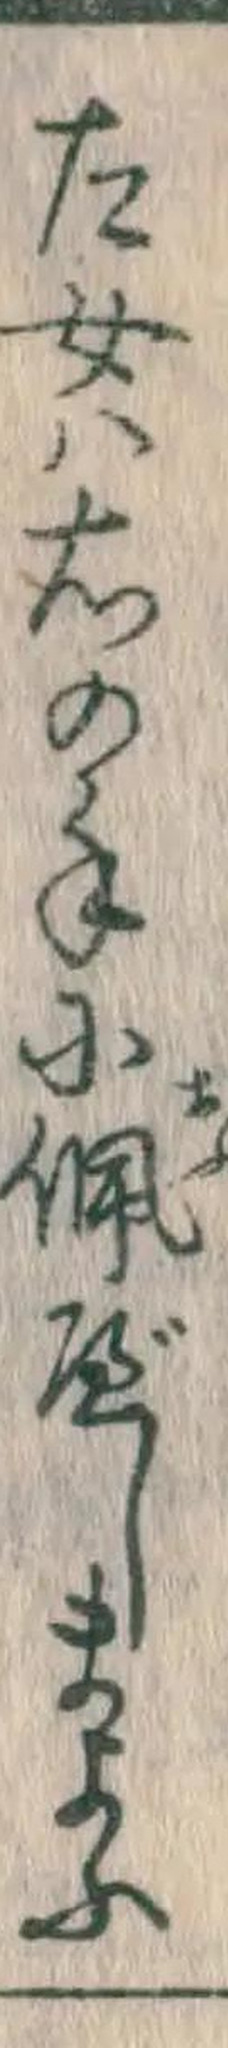左女は右の手に佩べしまよふ
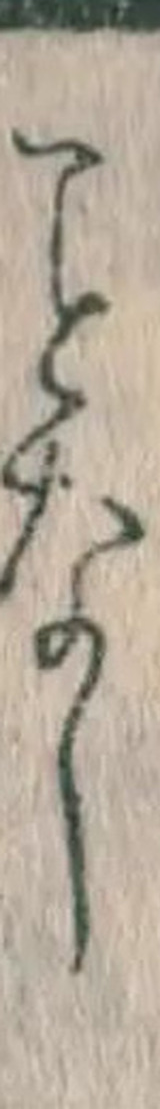ことなし
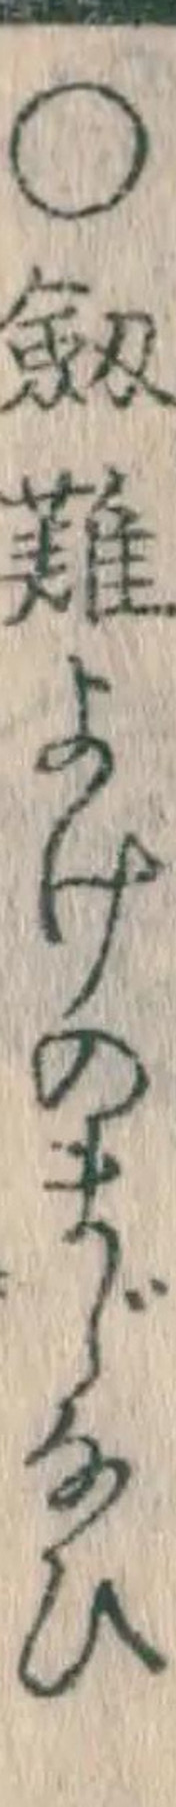○剣難よけのまじなひ
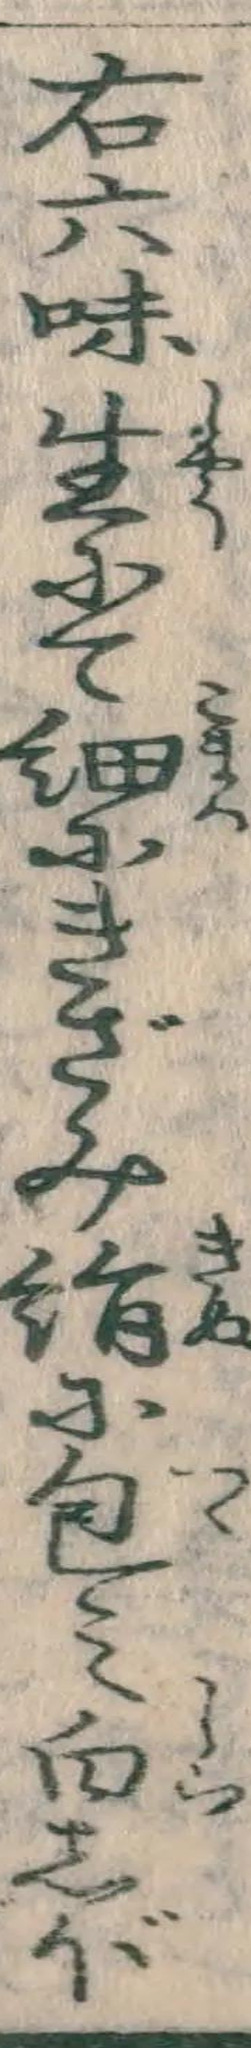右六味生にて細にきざみ絹に包み白しぼ
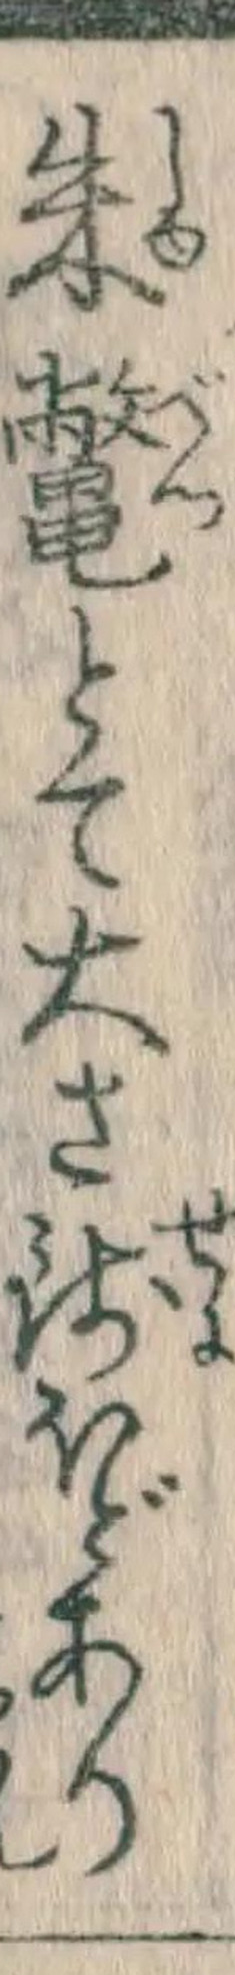朱鼈とて大さ銭ほどあり
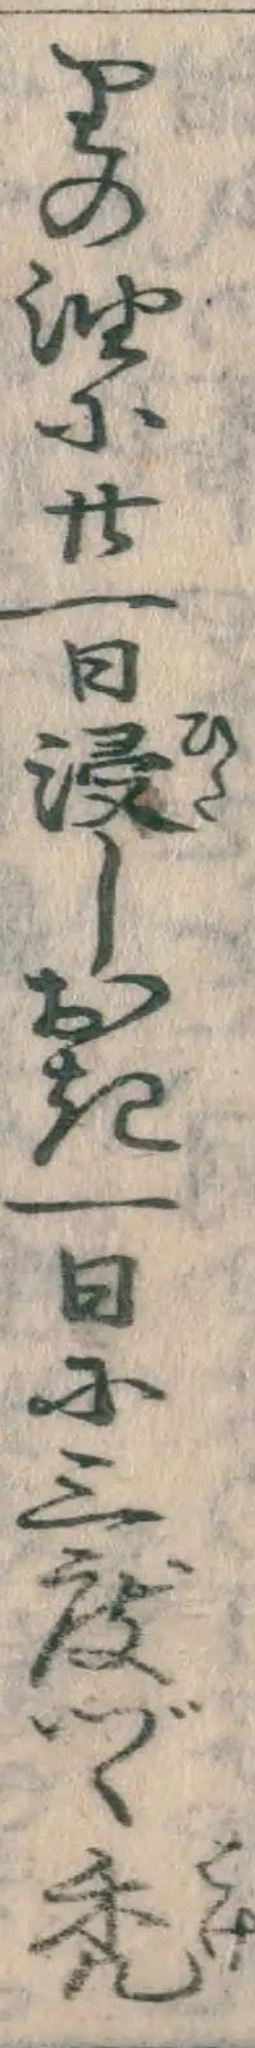りの油に廿一日浸しおき一日に三度づゝ禿
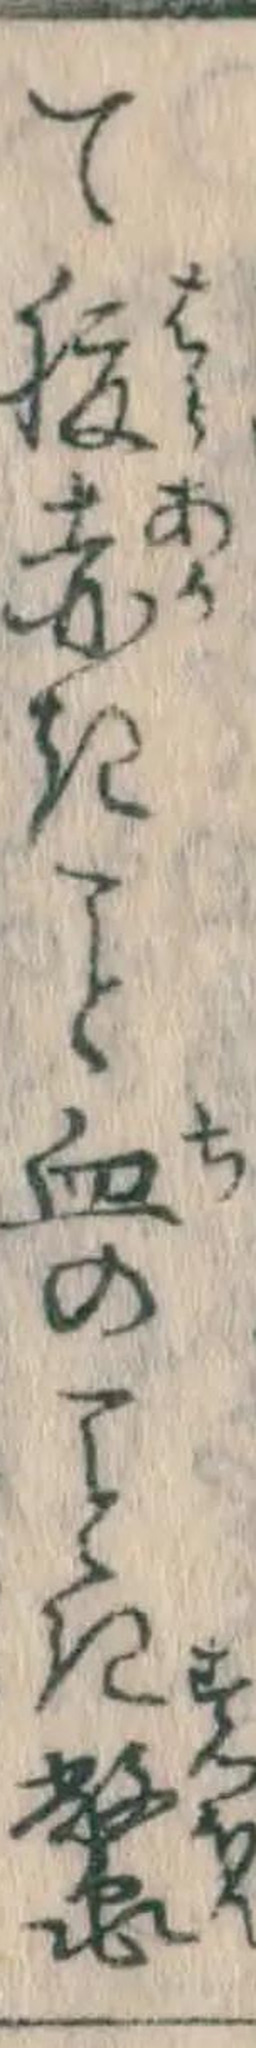て腹赤きこと血のことき鼈
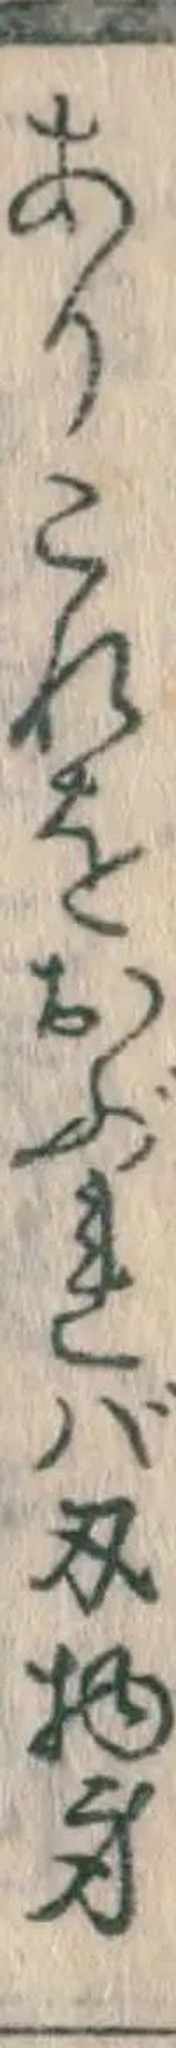ありこれをおぶれば刃物身
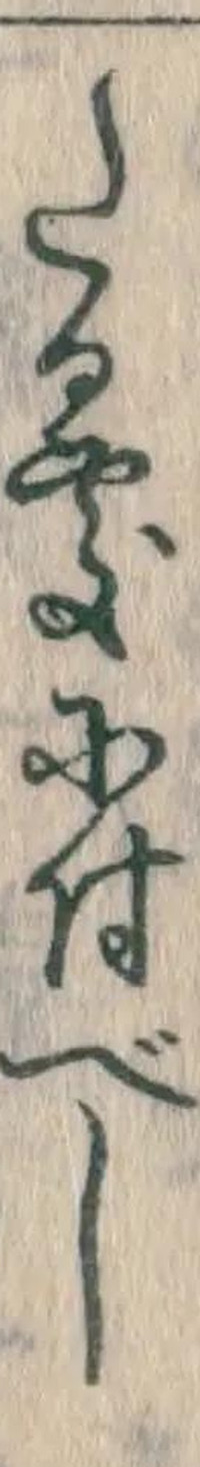たる処に付べし
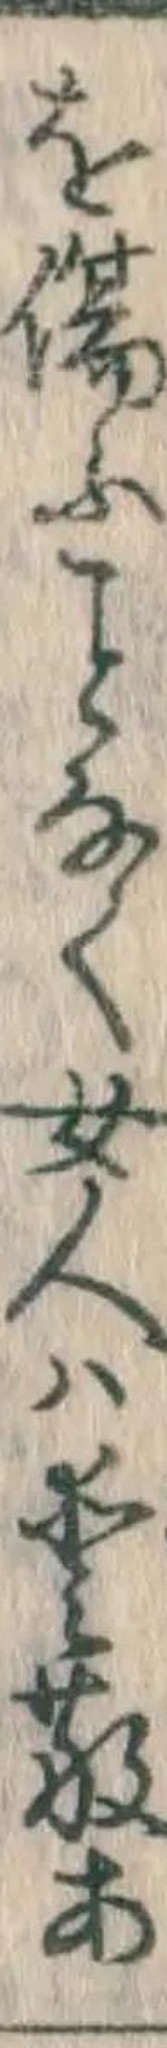を傷ふことなく女人は愛敬あ
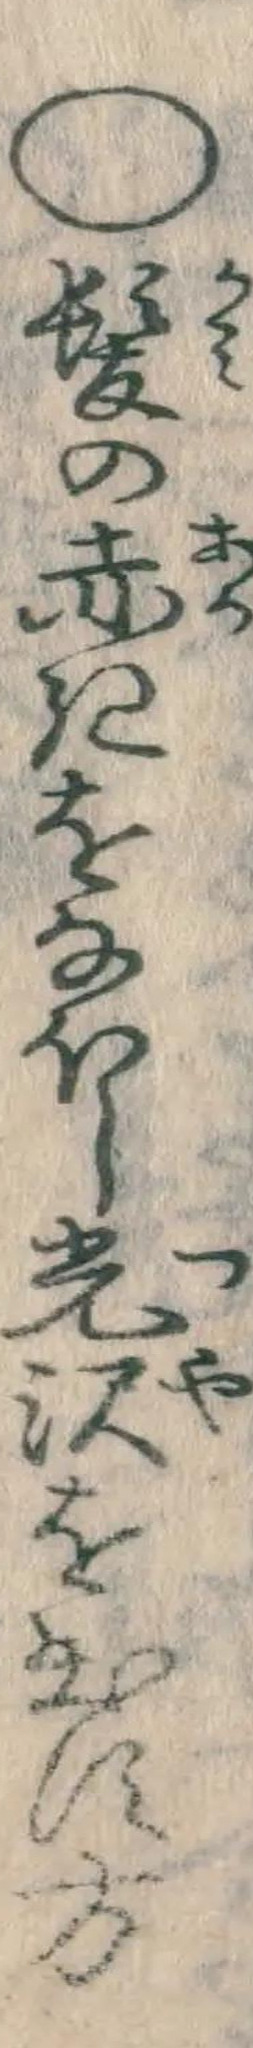○髪の赤きをなほし光沢を出す方
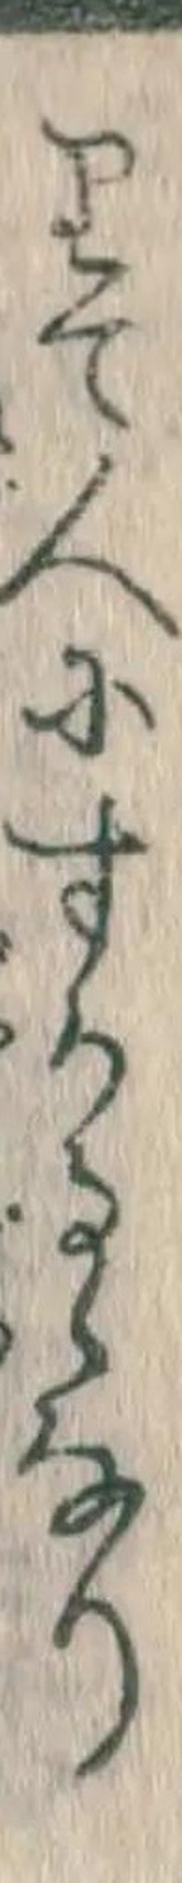りて人にすかるゝなり
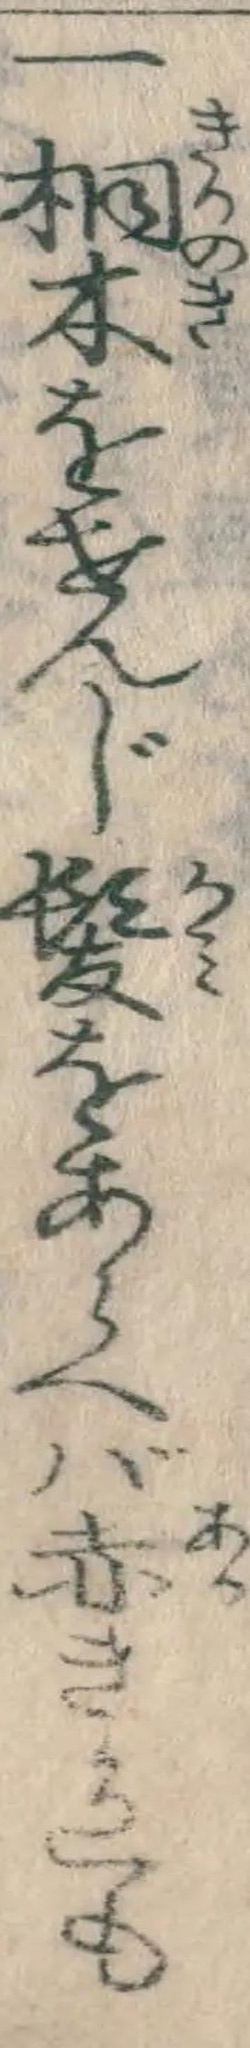一桐木をせんじ髪をあらへば赤き色も
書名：広益秘事大全 3巻. [4]
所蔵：国立国会図書館 National Diet Library, JAPAN
